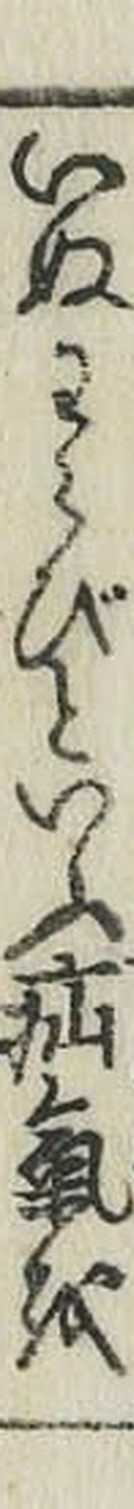いぬわらびといふ疝気を
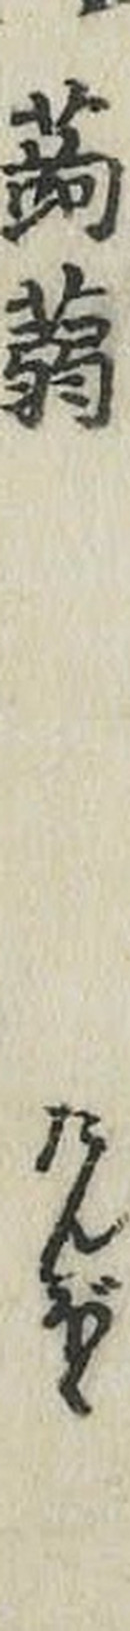蒲英たんぼゝ

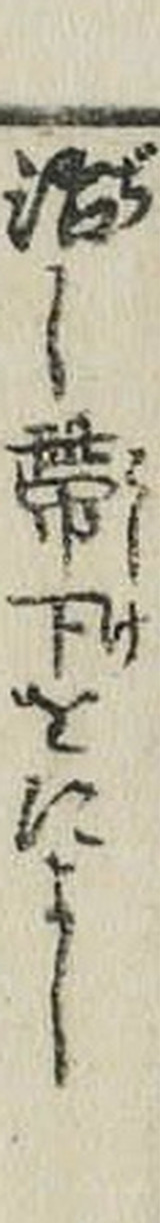治し帯下をによし
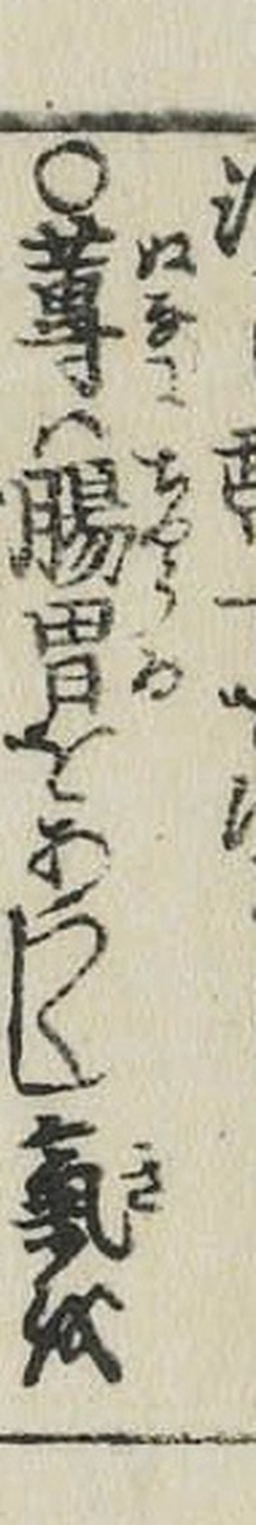○蓴は腸胃をあつくし気を
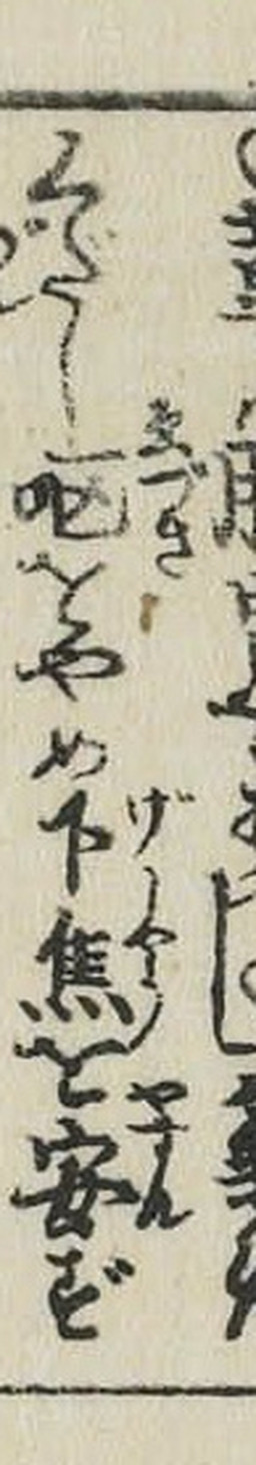くだし嘔をやめ下焦を安ず
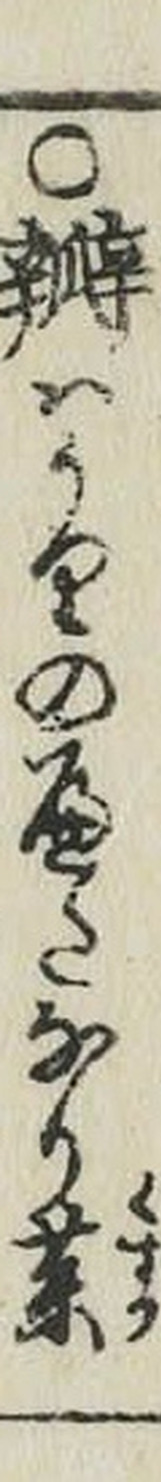○瓣はうりのへたなり薬
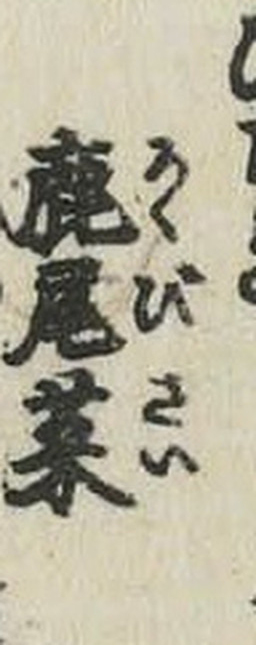鹿尾菜
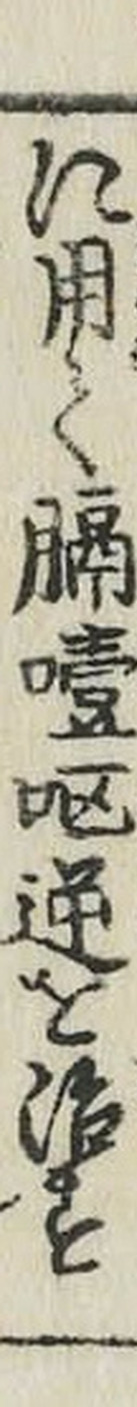に用て膈噎嘔逆を治す
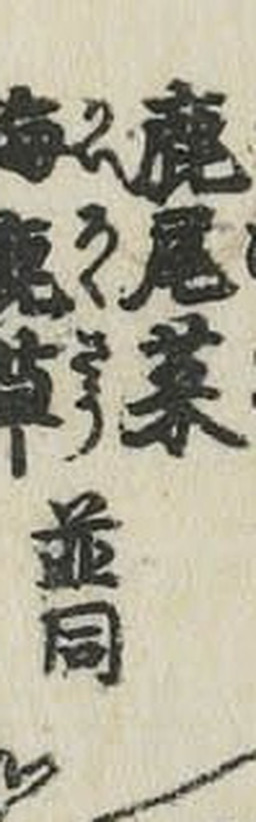海鹿草並同
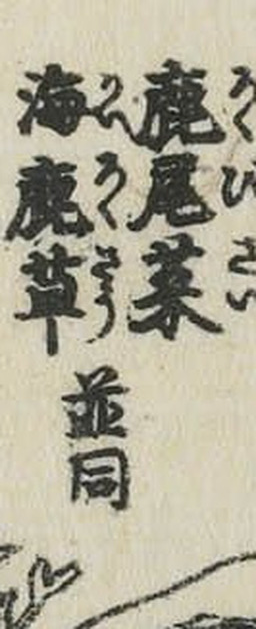海鹿草並同
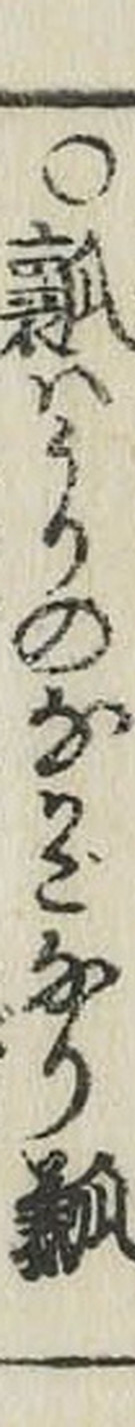○瓤はうりのなかごなり㼓
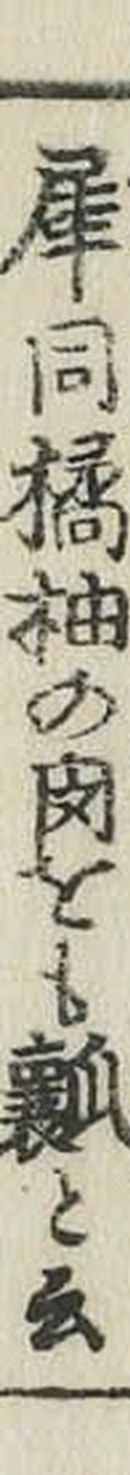犀同橘油の肉をも瓤と云
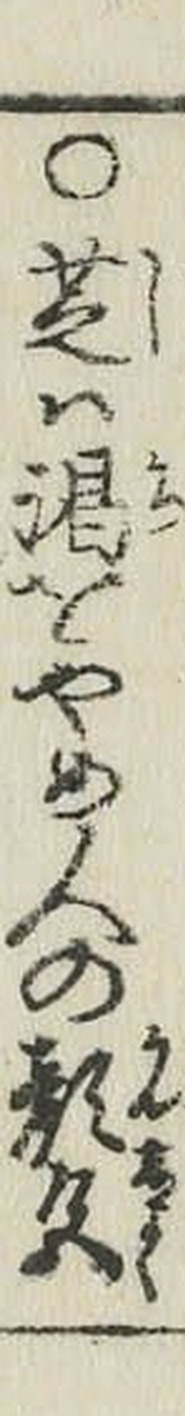○芝は渇をやめ人の顔色
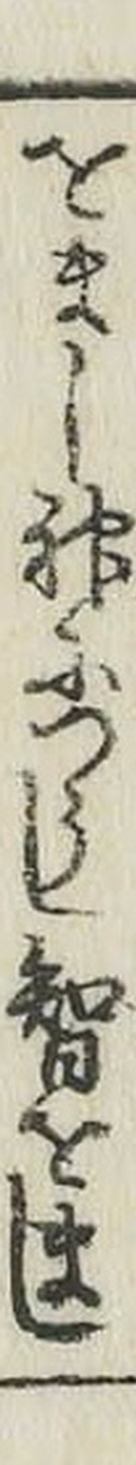をまし神につうし智をまし
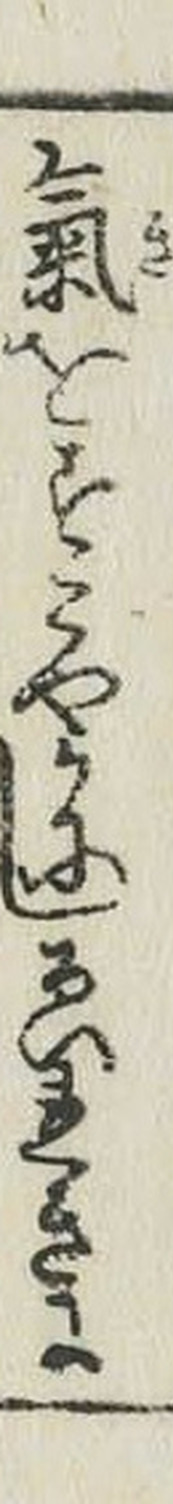気をすこやかにしるいれきに
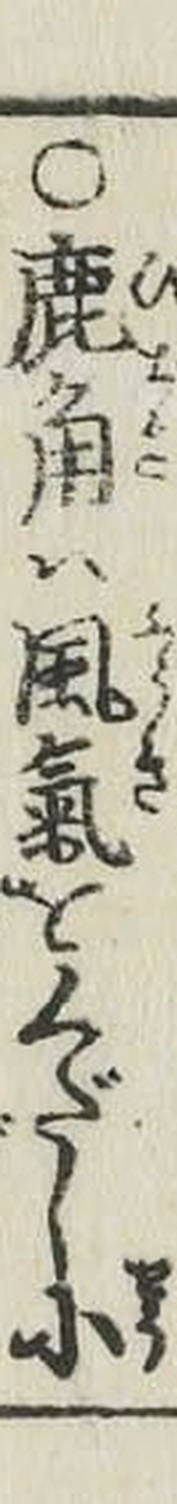○鹿角は風気をくだし小
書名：増補頭書訓蒙図彙大成 10巻 8:巻之17-19
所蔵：東京学芸大学教育コンテンツアーカイブ
